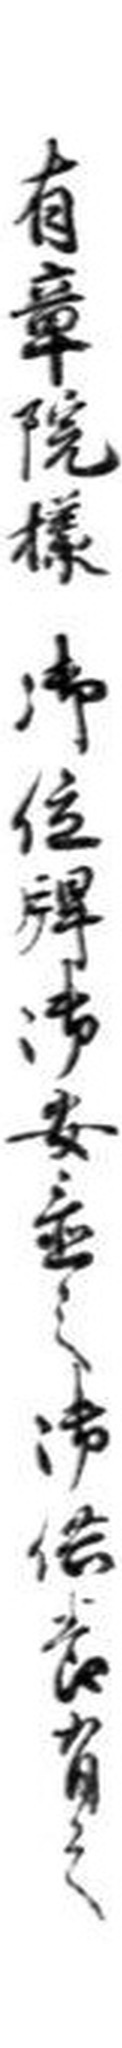有章院様御位牌御安置之御供養有之
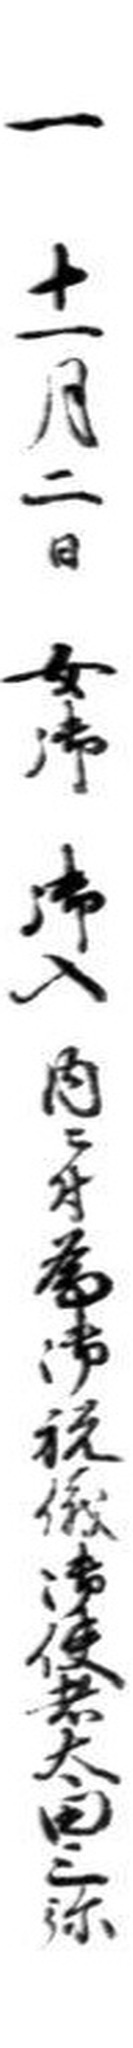一十一月二日女御御入内ニ付為御祝儀御使者太田三弥
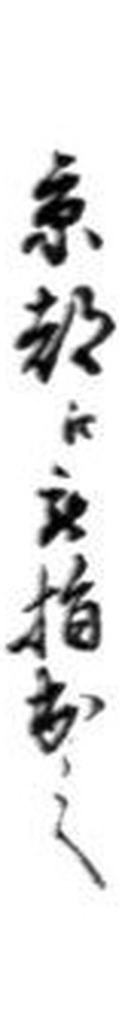京都江被指出之
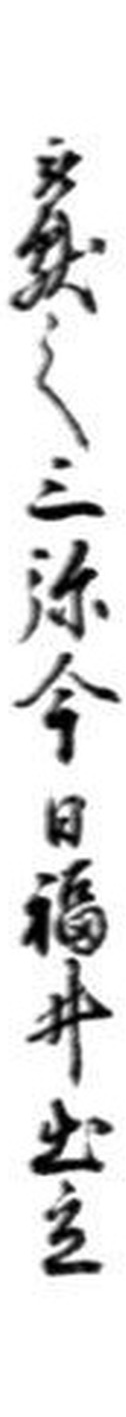被献之三弥今日福井出立
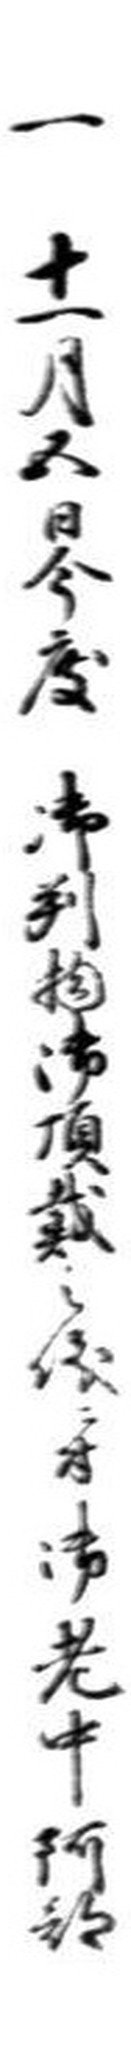一十一月五日今度御判物御頂戴之儀ニ付御老中阿部
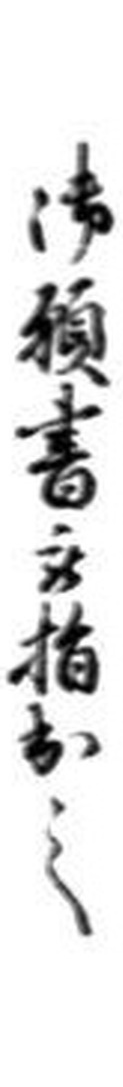御願書被指出之
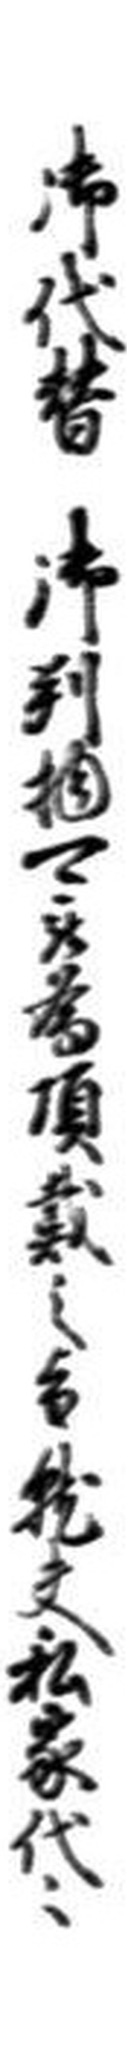御代替御判物可被為頂戴之旨就夫私家代々
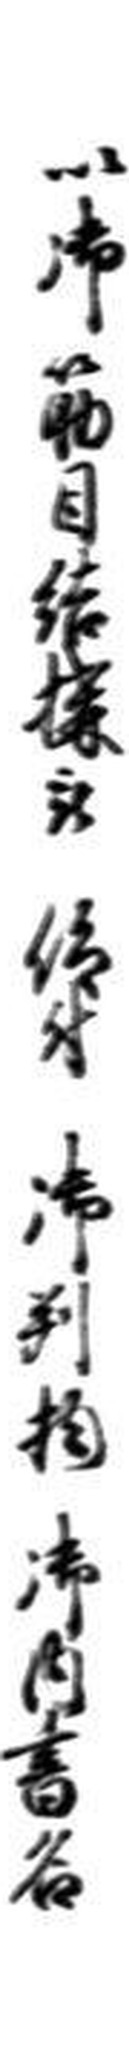以御筋目結構被仰付御判物御内書名
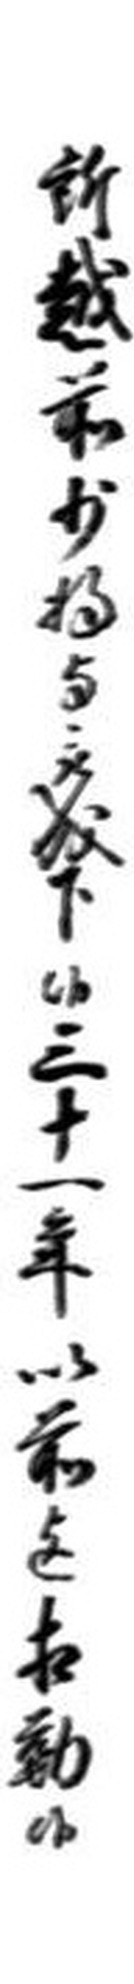所越前少将と被成下候三十一年以前迄相勤候
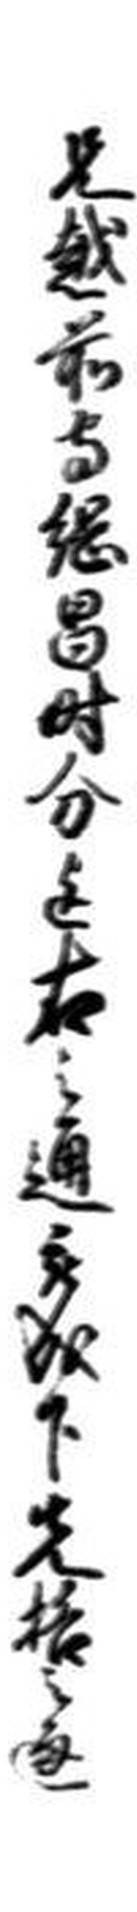兄越前守綱昌時分迄右之通被成下先格之通
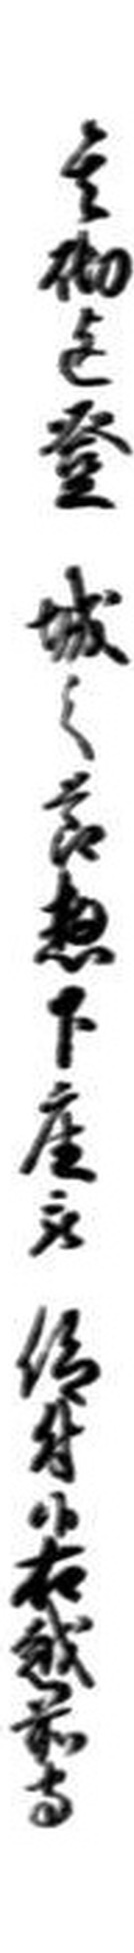其砌迄登城之節惣下座被仰付候右越前守
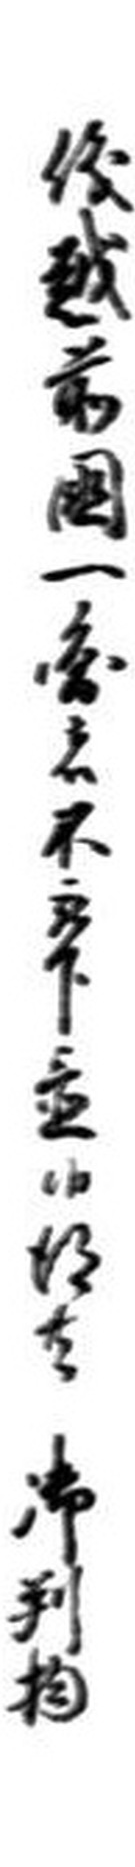儀越前国一円者不被下置候得共御判物

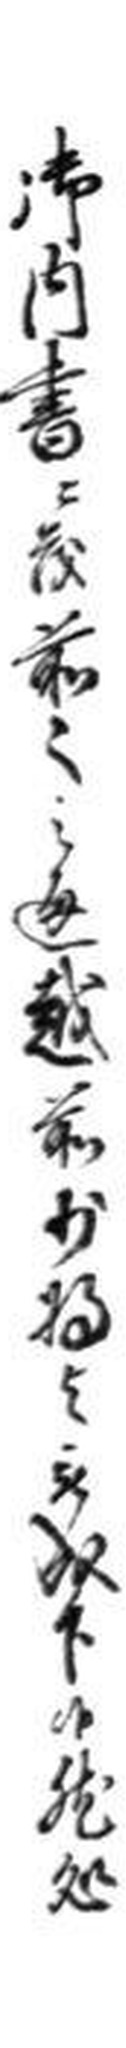御内書ニも前々之通越前少将と被成下候然処
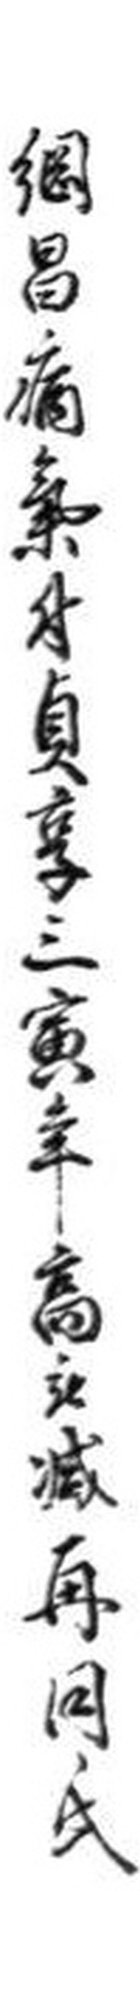綱昌病気付貞享三寅年高被減再同氏
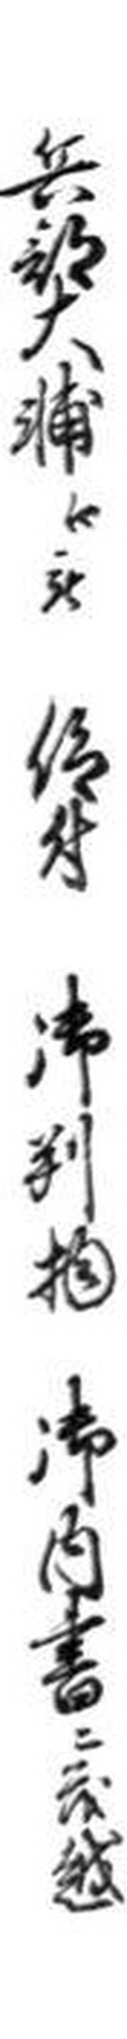兵部大輔江被仰付御判物御内書ニも越
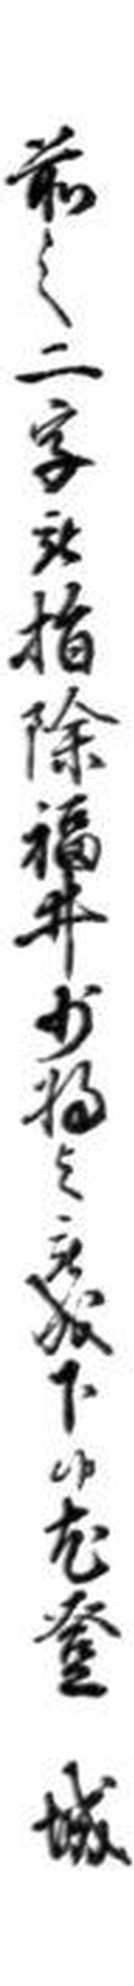前之二字被指除福井少将と被成下候尤登城
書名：家譜 三十一 吉邦公 享保元年
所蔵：福井県文書館 Fukui Prefectural Archives
